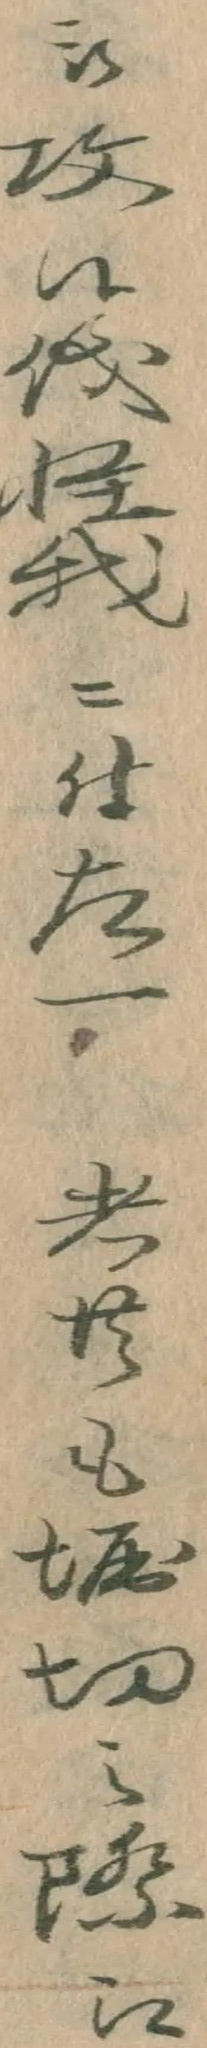被攻候儀怪我に付左一者共も堀切之際江
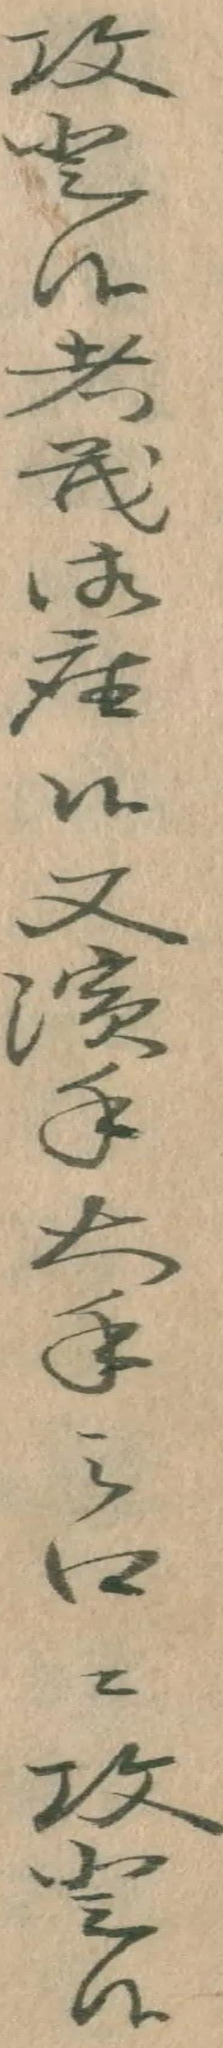攻登候者茂御座候又浜手大手之口に攻登候
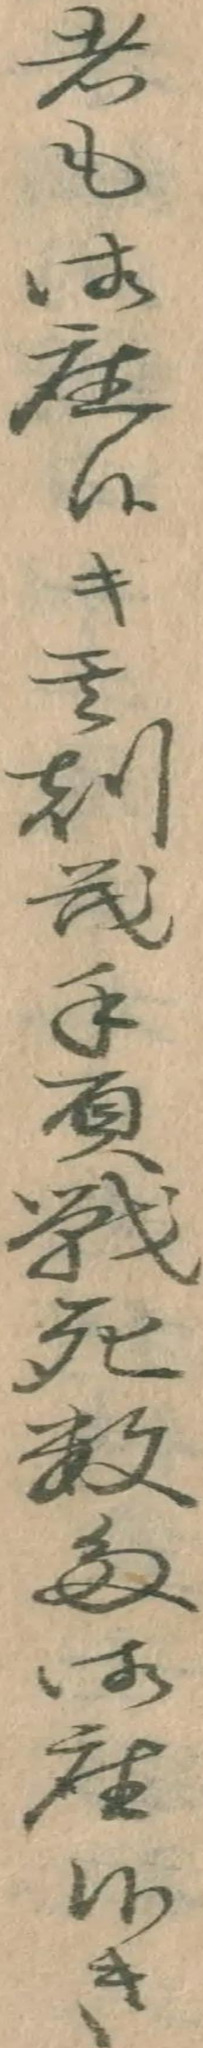者も御座候き其刻茂手負戦死数多御座候き
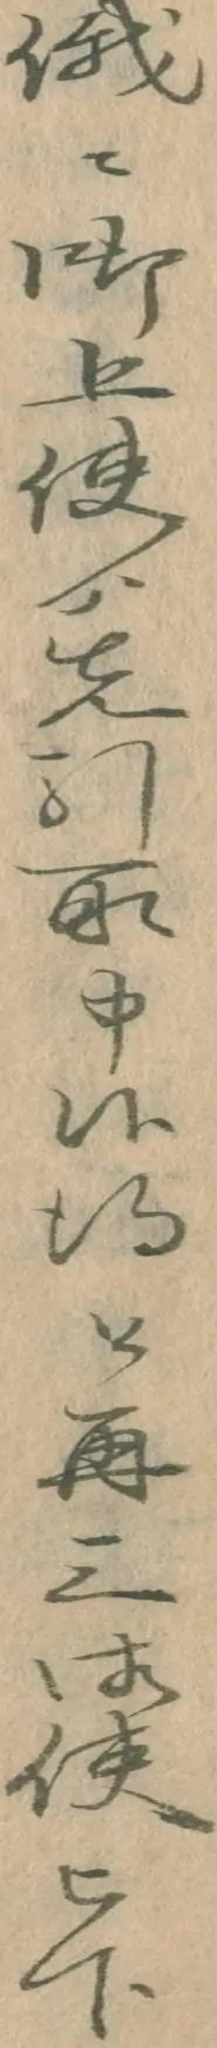俄に御上使ゟ先引取申候得と再三御使被下

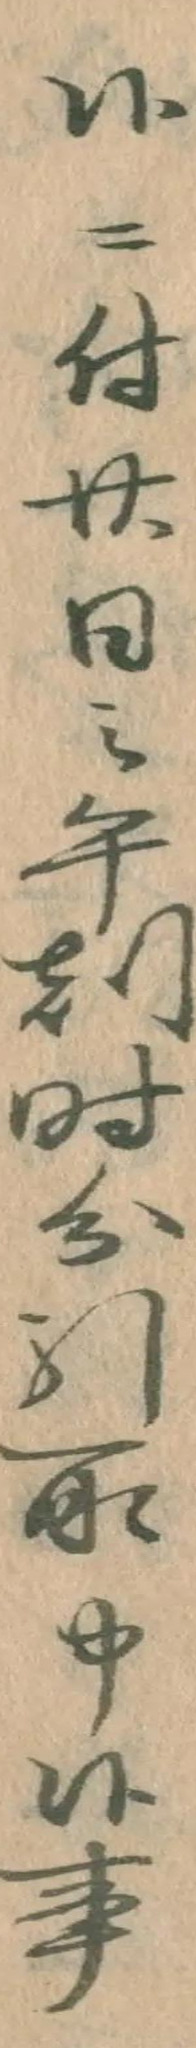候に付廿日之午刻時分引取申候事
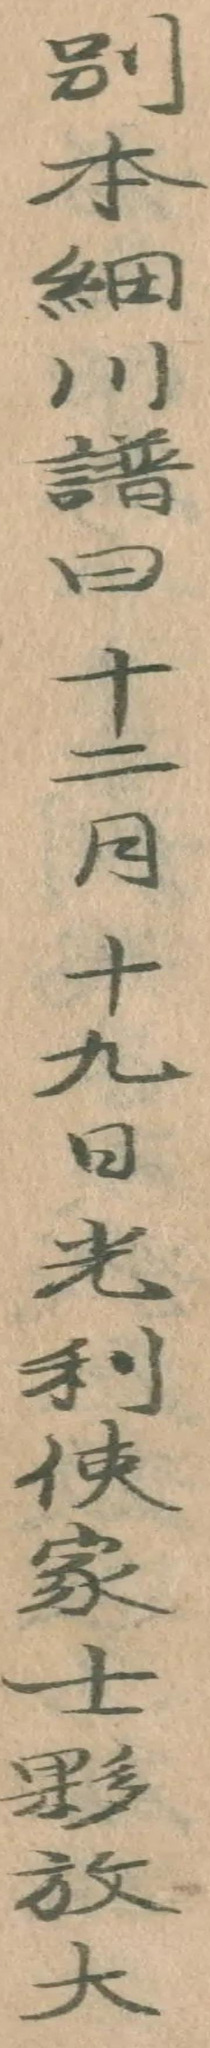別本細川譜曰十二月十九日光利使家士夥放大
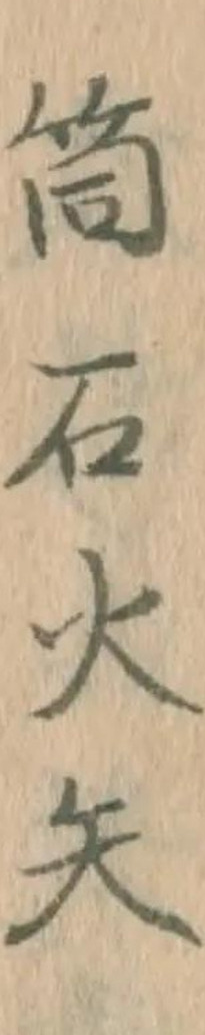筒石火矢
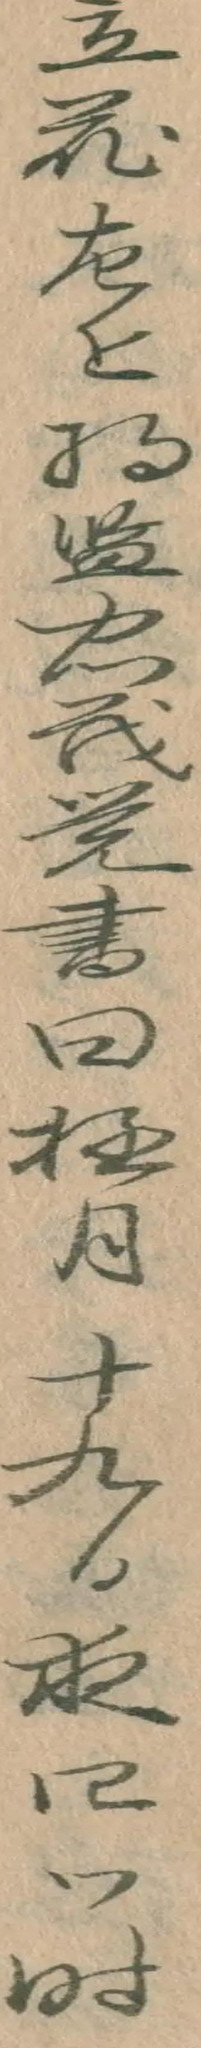立花左近将監忠茂覚書曰極月十九日夜四つ時
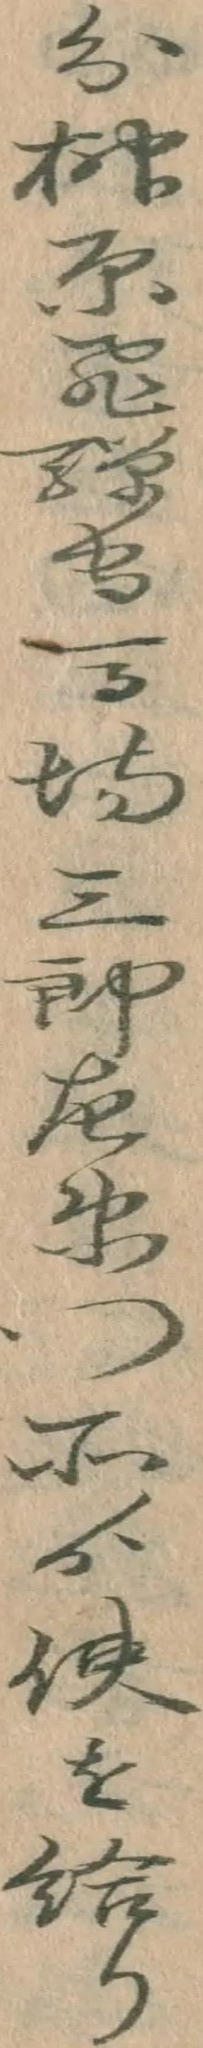分榊原飛騨守馬場三郎左衛門所ゟ使を給り
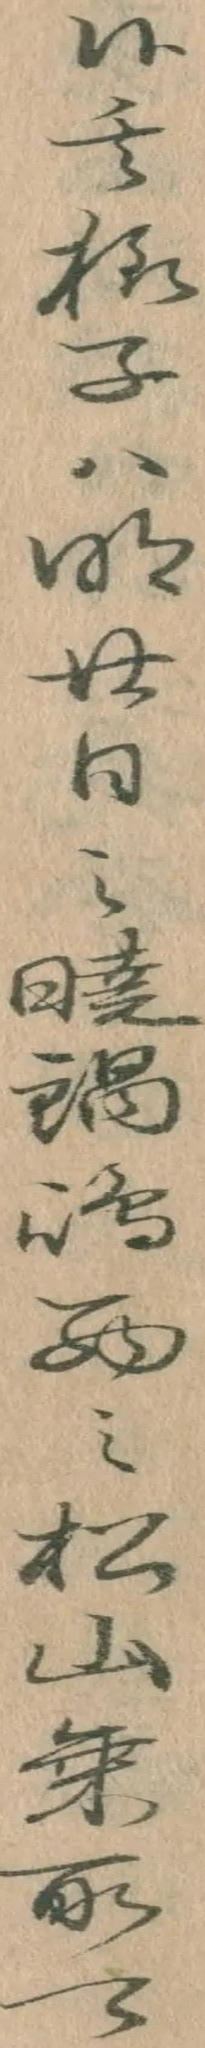候其様子は明廿日之暁鍋島西之松山乗取可
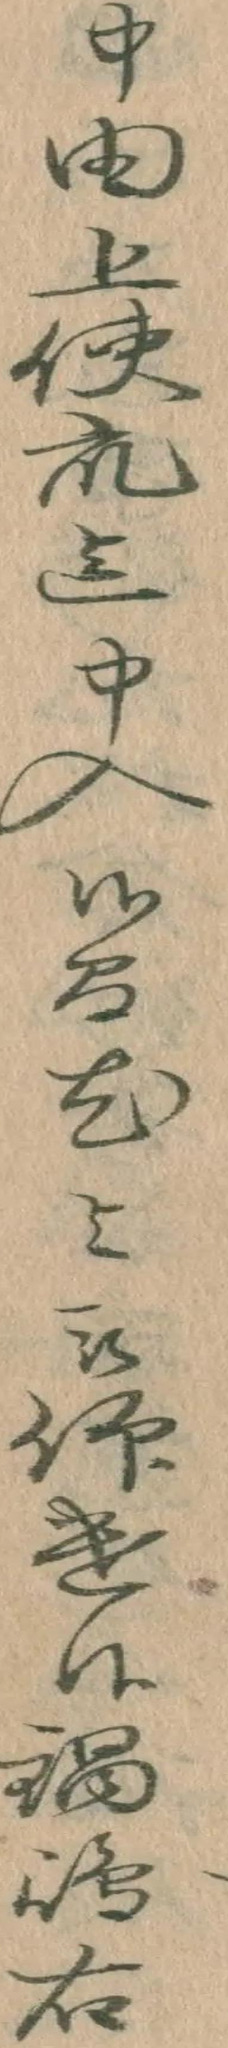申由上使衆迄申入候間尤与被仰遣候鍋島右
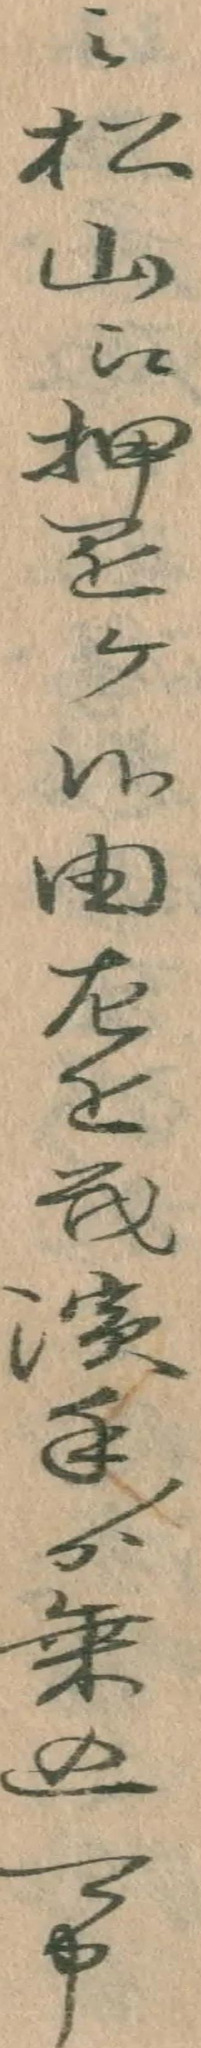之松山江押懸け候由左近茂浜手ゟ乗込可申
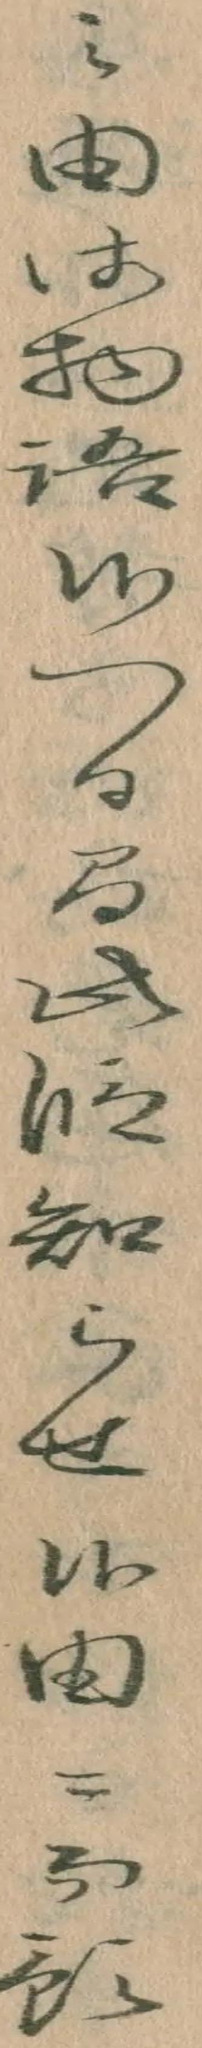之由御物語候つる間此段知らせ候由に而預
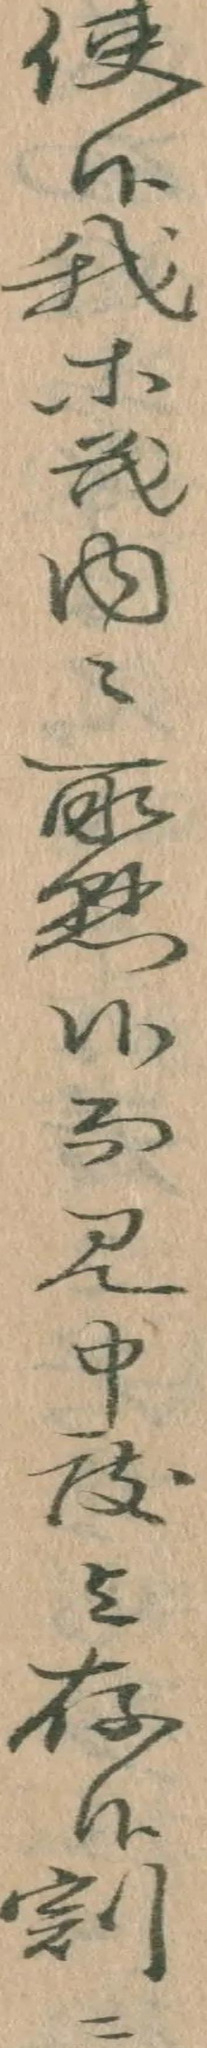使候我等も内に取懸候而見申度与存候割に
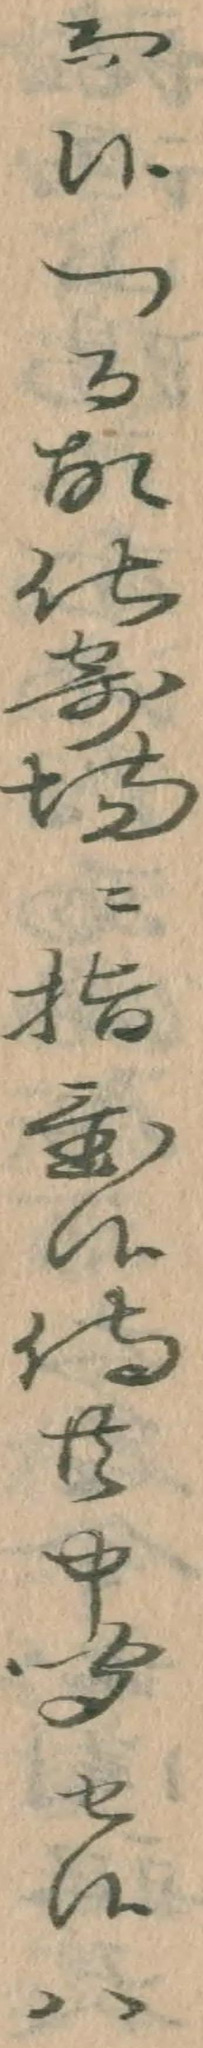而候つる故仕寄場に指置候侍共申聞せ候は
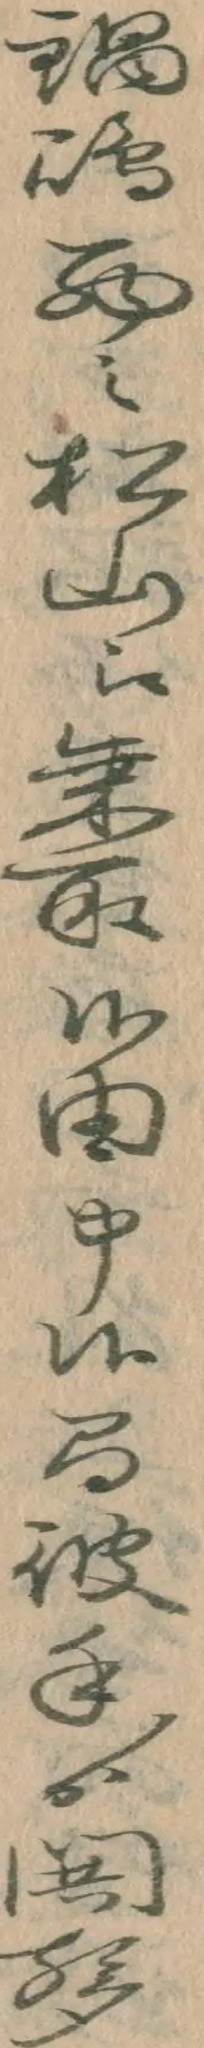鍋島西之松山江乗取候由申候間彼手ゟ鬨声
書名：切支丹御退治記 49巻. [4]
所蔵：国立国会図書館 National Diet Library, JAPAN
